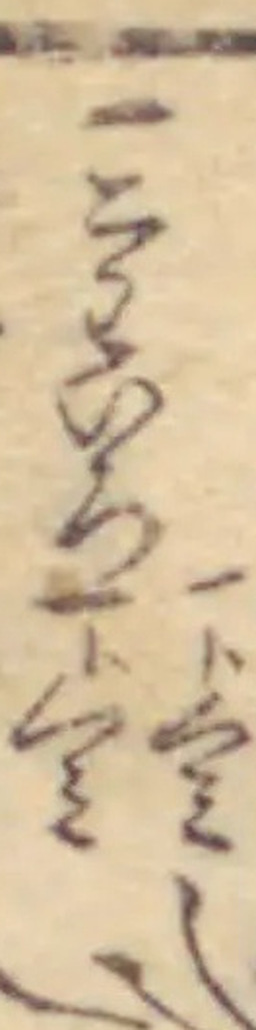一こわいろ一トくみ
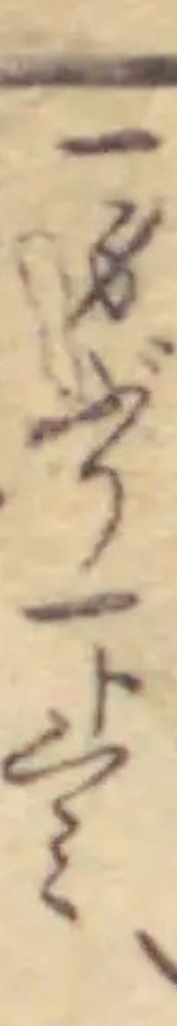一身ぶり一トくみ
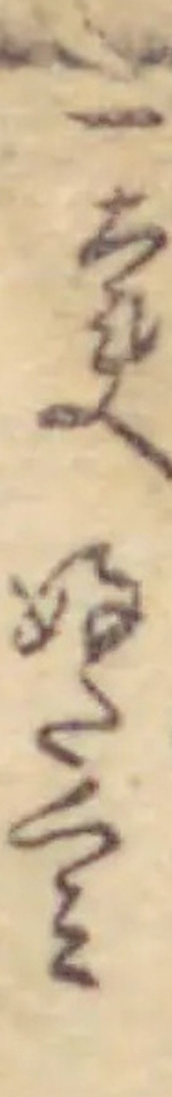一太夫ふたくみ
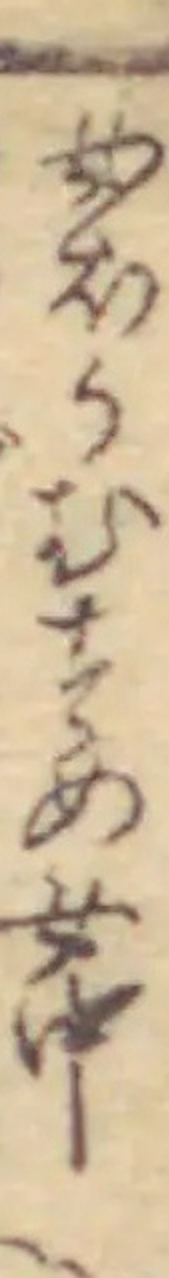女ほうむすめ女中
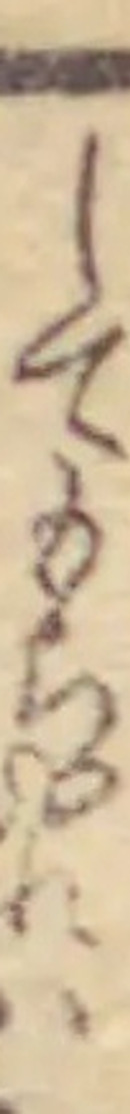してもちゆれは
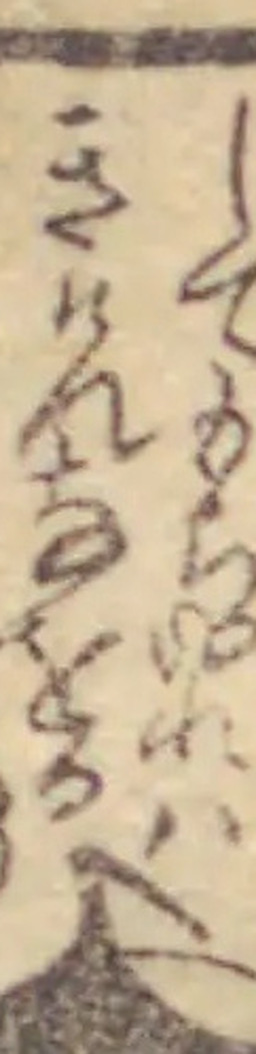きけんなをる事
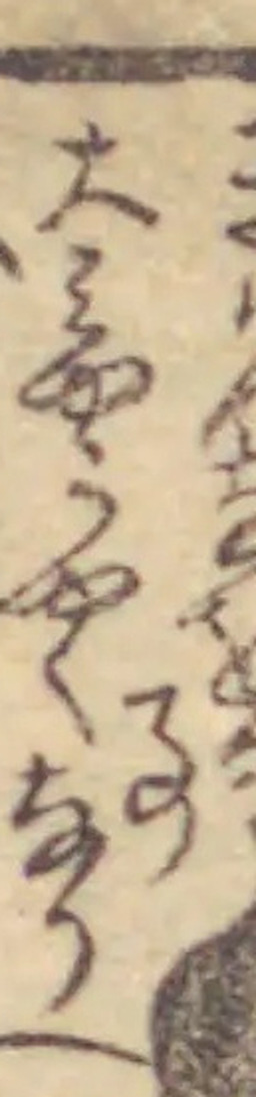大みやうやくなり
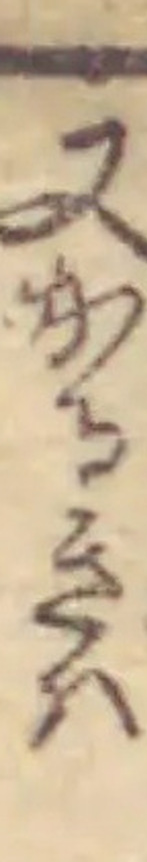又かるきは
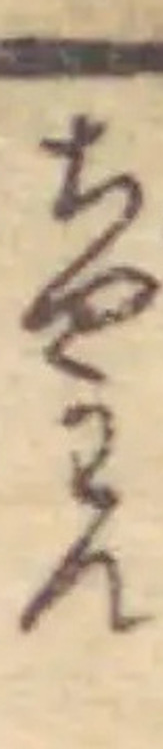ちやわん
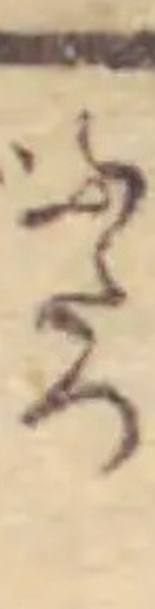ふたつ
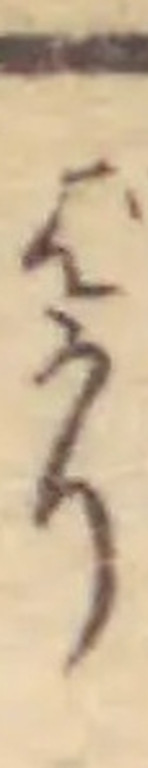ばかり
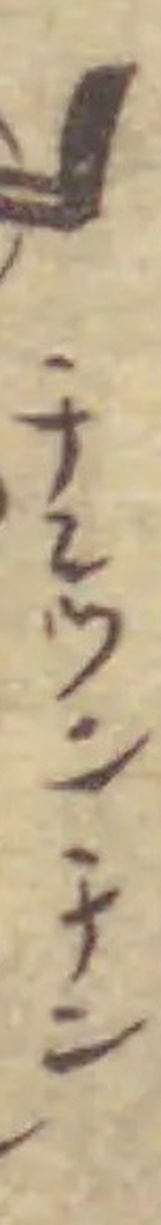チンツンチン
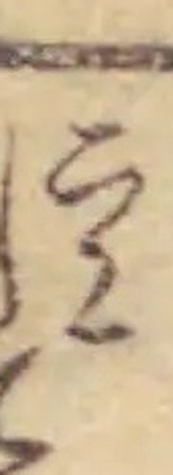どうして
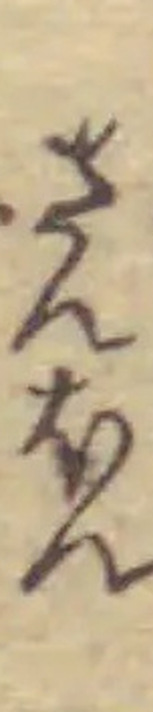さんほん
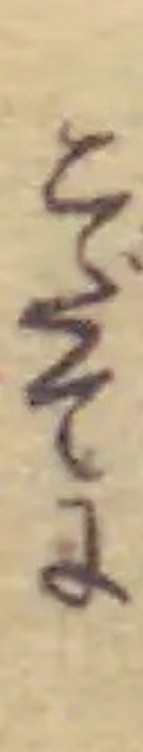こだてに

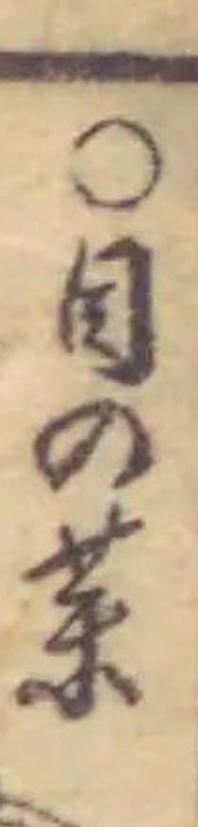〇目の薬
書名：家伝寿命薬 2巻
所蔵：国立国会図書館 National Diet Library, JAPAN
